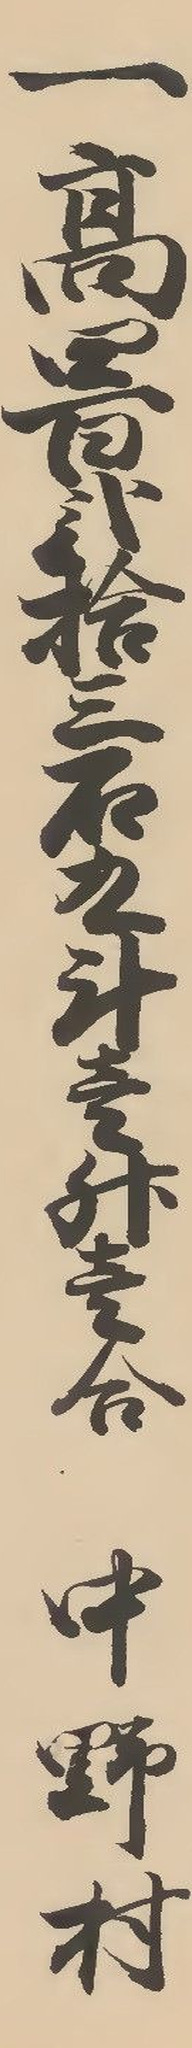一髙四百弐拾三石九斗壱升壱合中野村
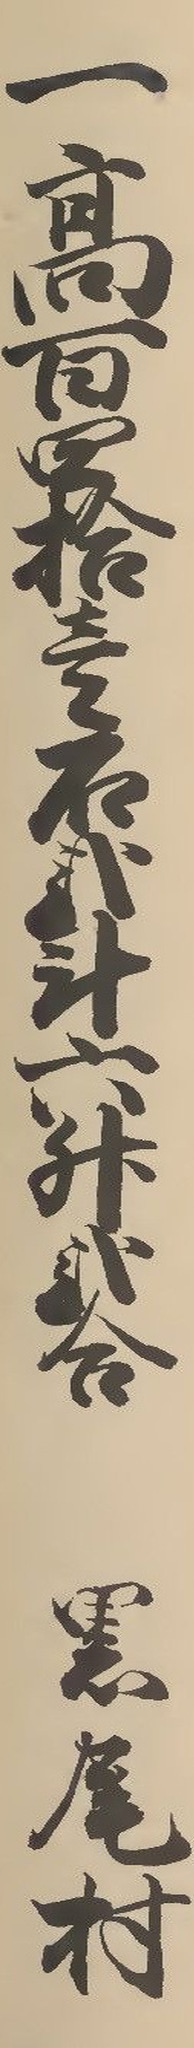一髙百四拾壱石弐斗六升弐合黑尾村
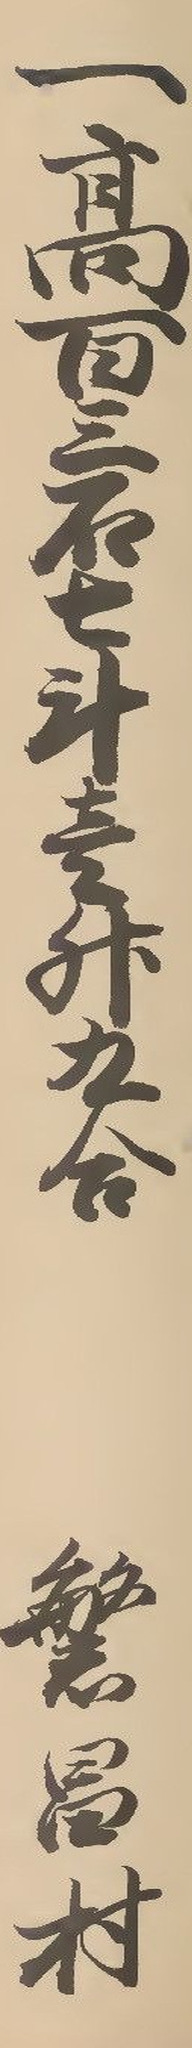一髙百三石七斗壱升九合繁昌村
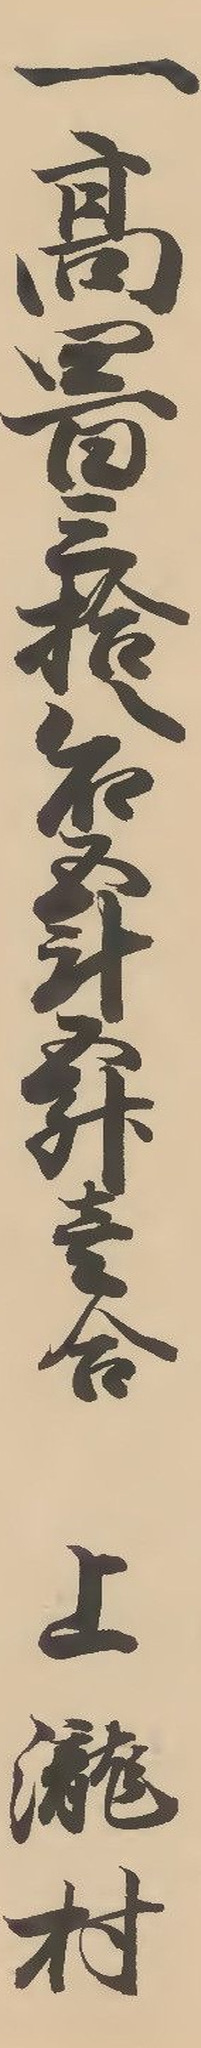一髙四百三拾八石五斗五升壱合上瀧村
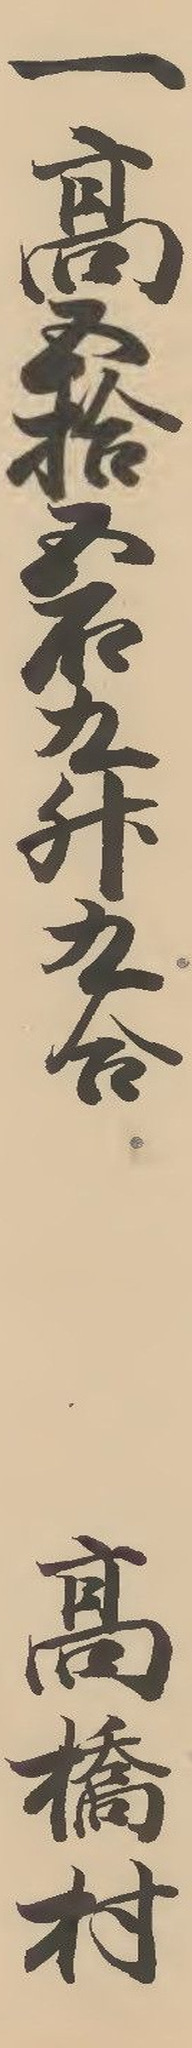一髙五拾五石九升九合高橋村
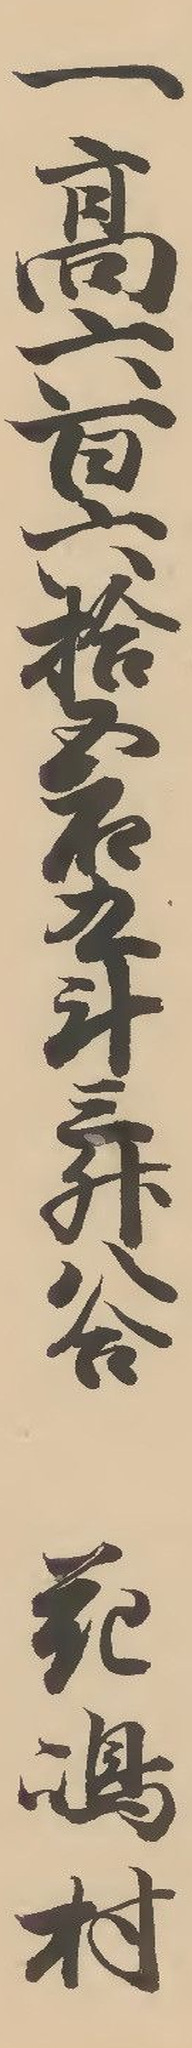一髙六百六拾五石九斗三升八合花嶋村

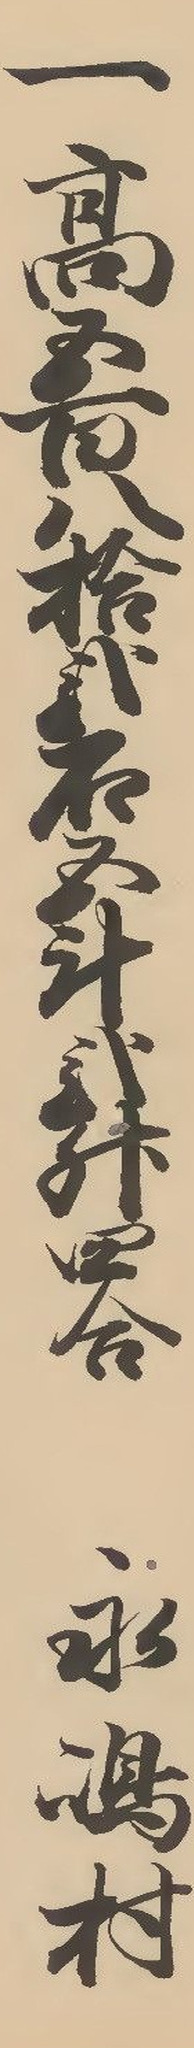一髙五百八拾弐石五斗弐升四合永嶋村
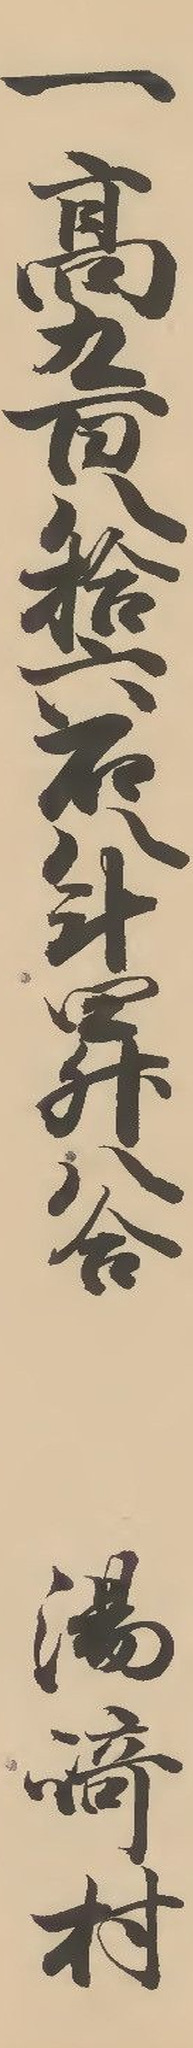一髙九百八拾六石八斗四升八合湯崎村
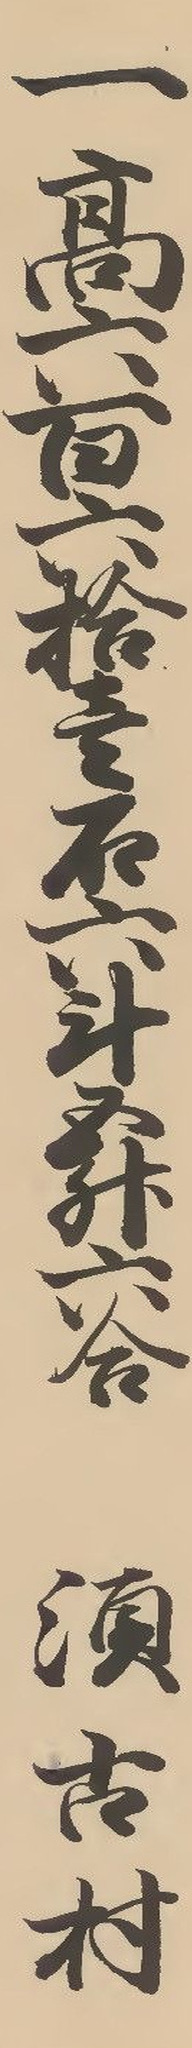一髙六百六拾壱石六斗五升六合須古村
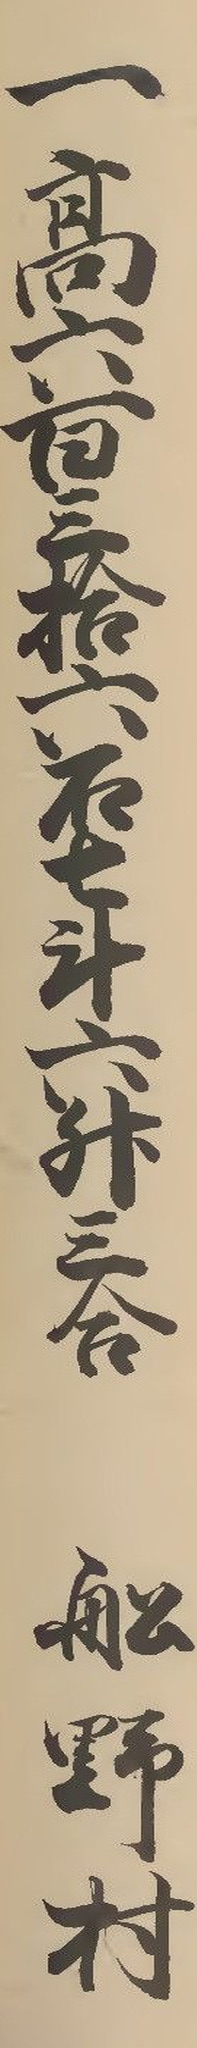一髙六百三拾六石七斗六升三合舩野村
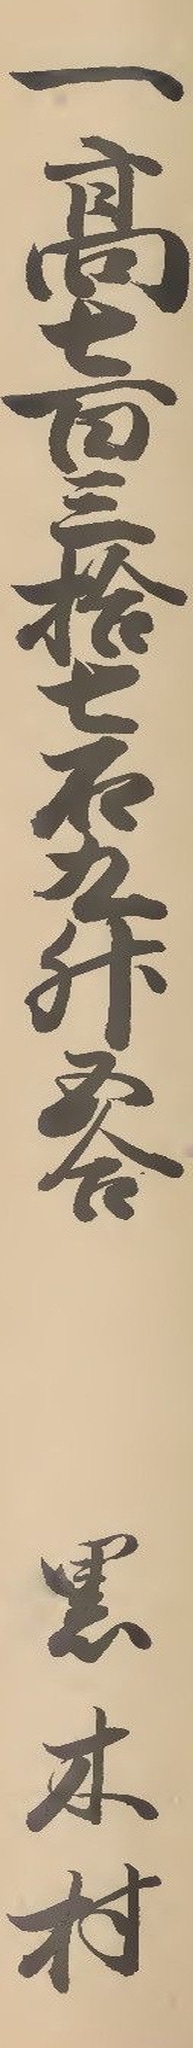一髙七百三拾七石九升五合黑木村
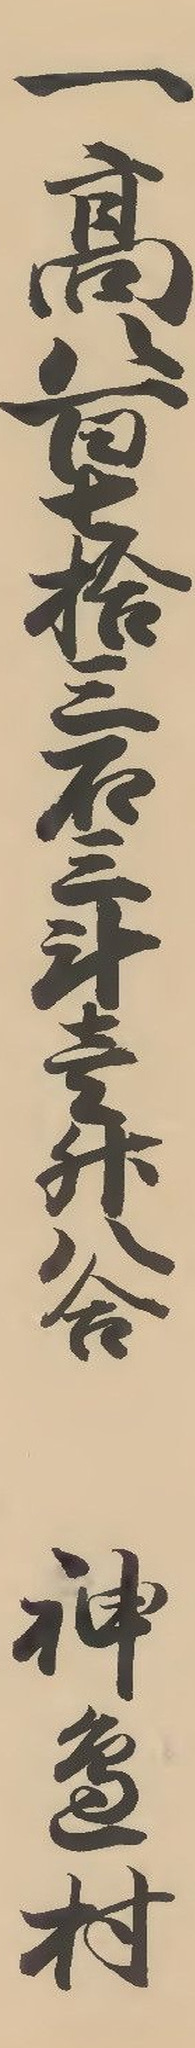一髙八百七拾三石三斗壱升八合神邊村
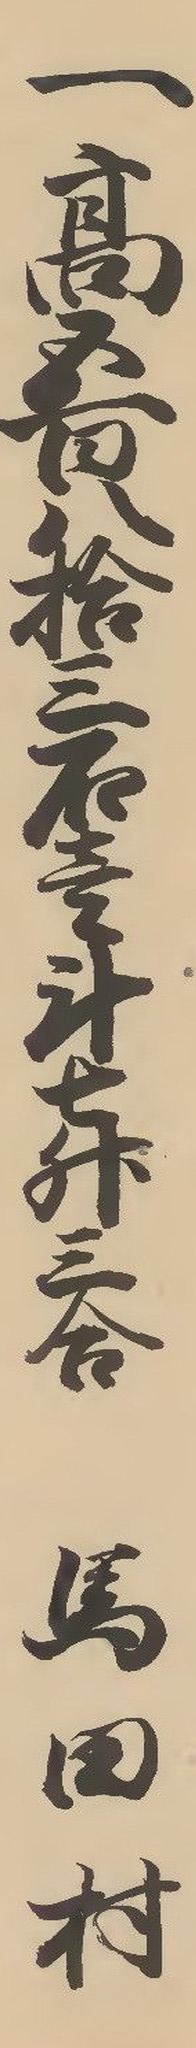一髙五百八拾三石壱斗七升三合馬田村
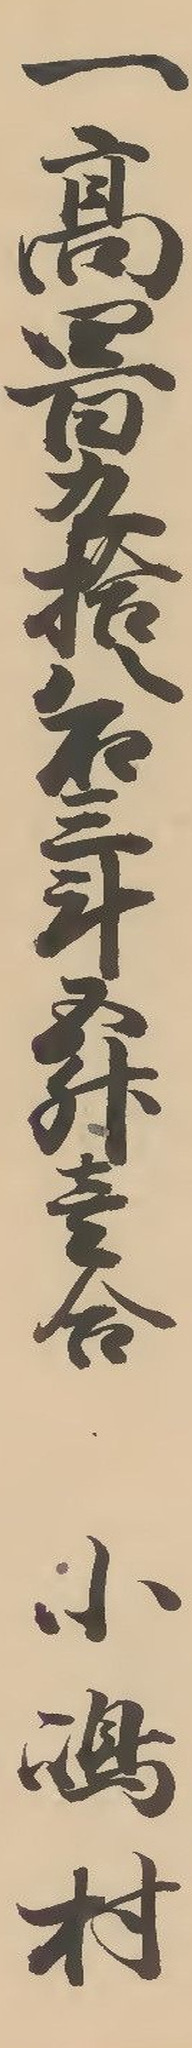一髙四百九拾八石三斗五升壱合小嶋村

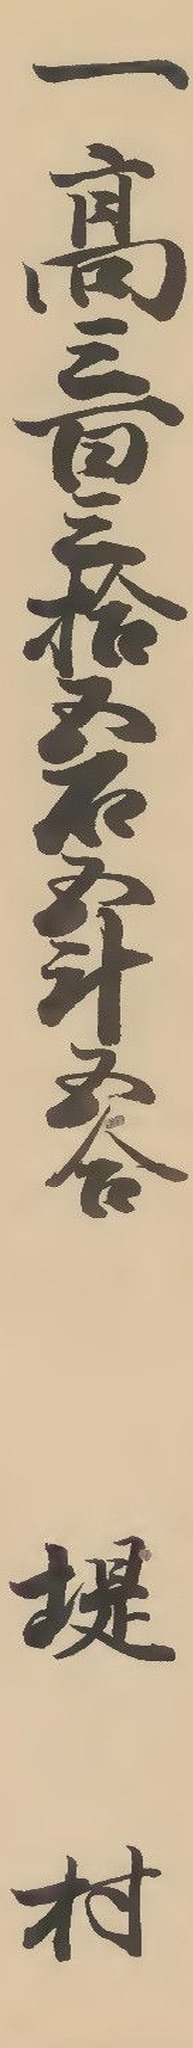一髙三百三拾五石五斗五合堤村
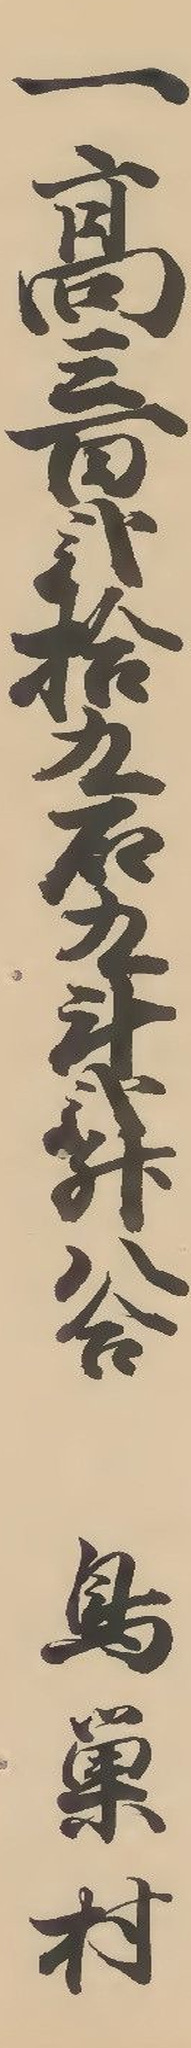一髙三百弐拾九石九斗弐升八合鳥巣村
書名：肥前国郷帳
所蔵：国立公文書館 National Archives of Japan
